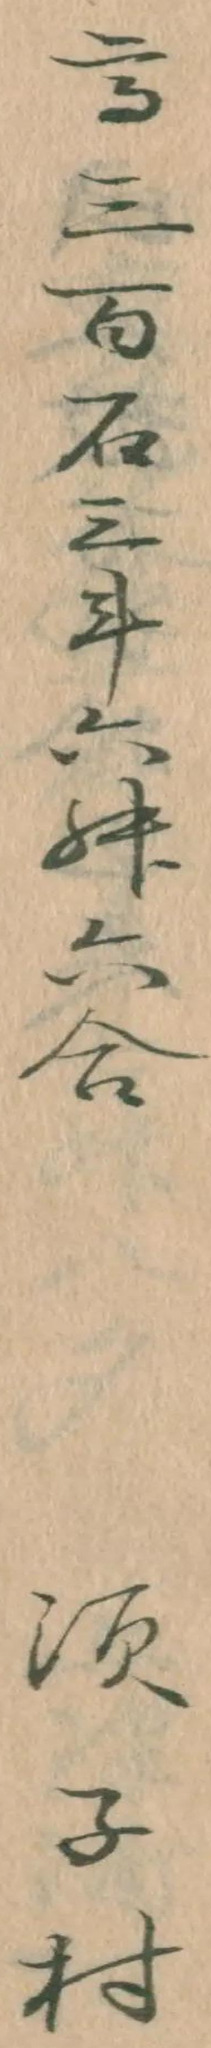高三百石三斗六升六合須子村
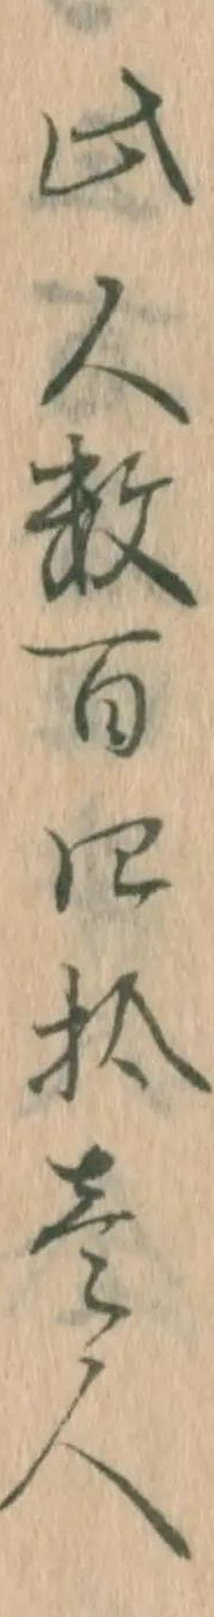此人数百四拾壱人
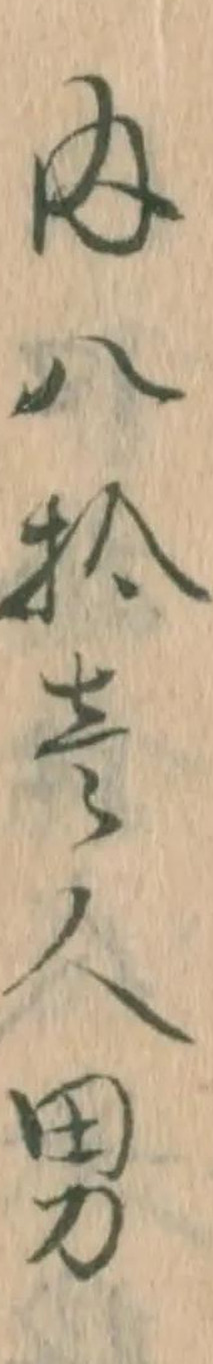内八拾壱人男
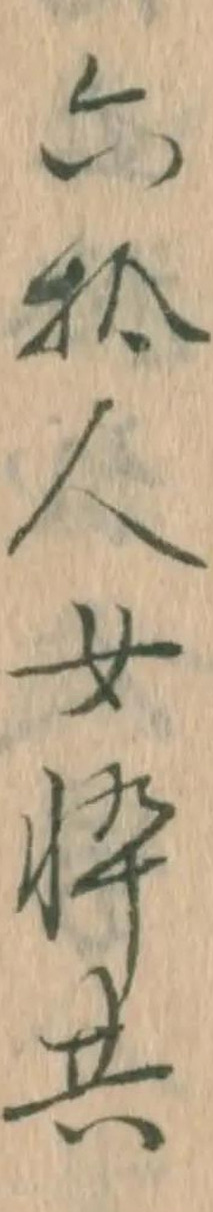六拾人女忰共
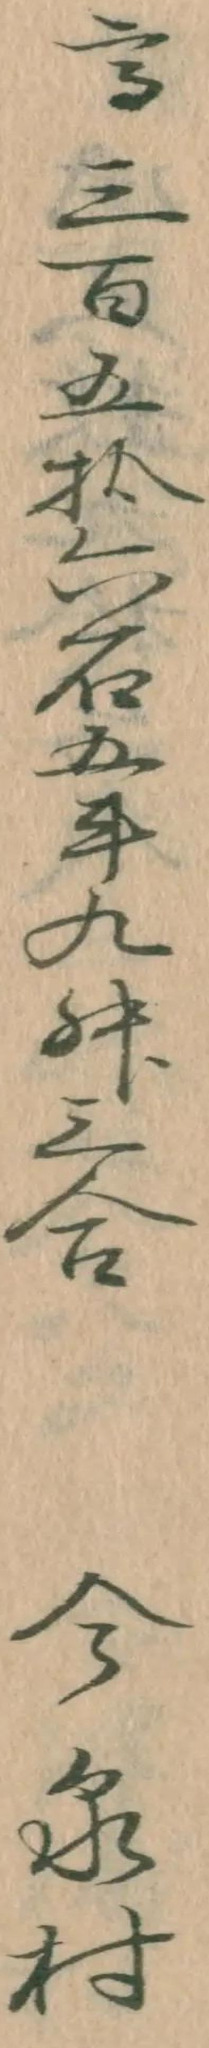高三百五拾六石五斗九升三合今泉村
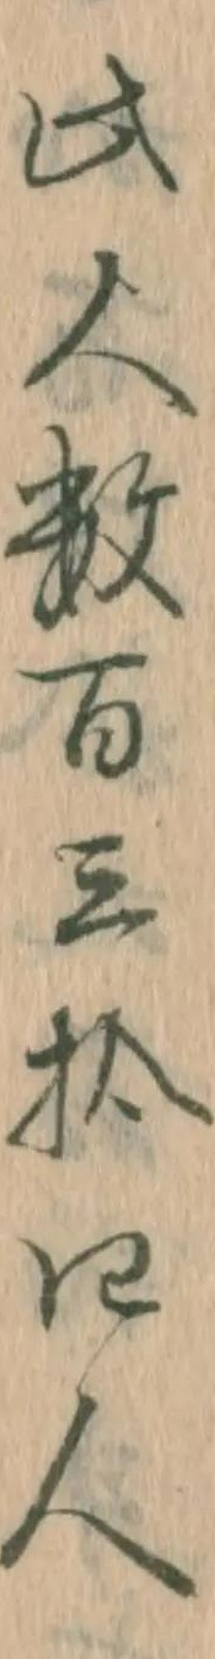此人数百三拾四人
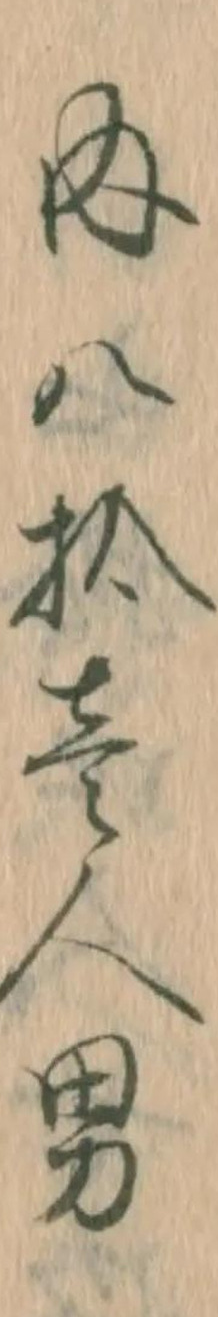内八拾壱人男
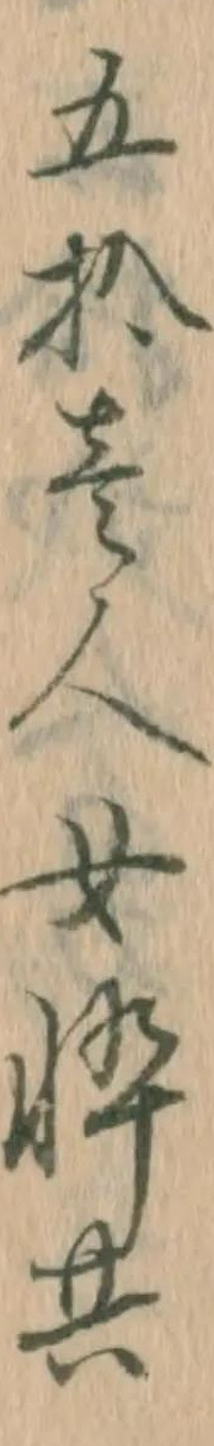五拾壱人女忰共
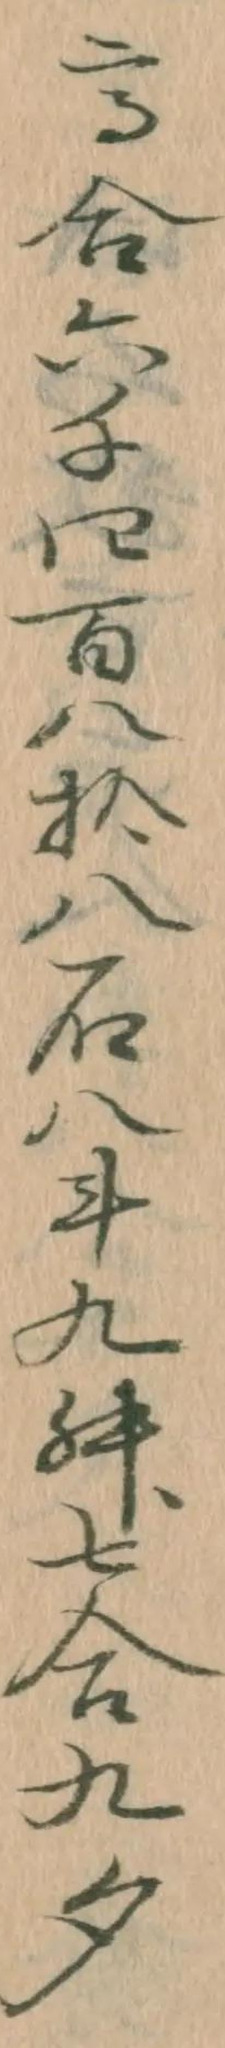高合六千四百八拾八石八斗九升七合九勺
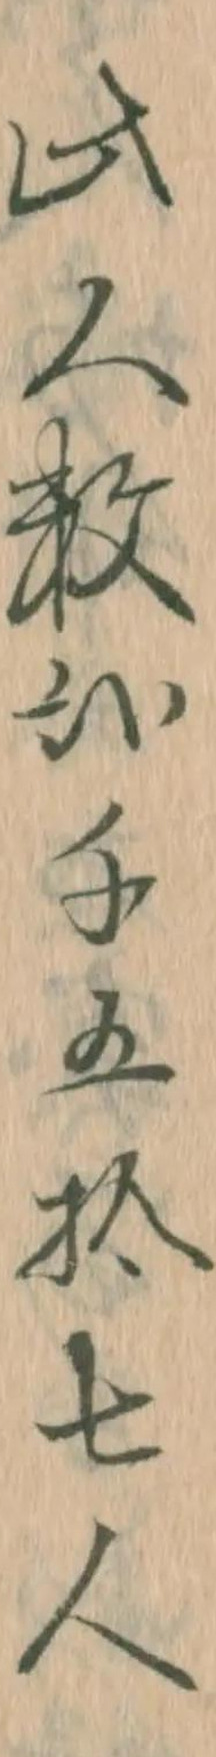此人数弐千五拾七人
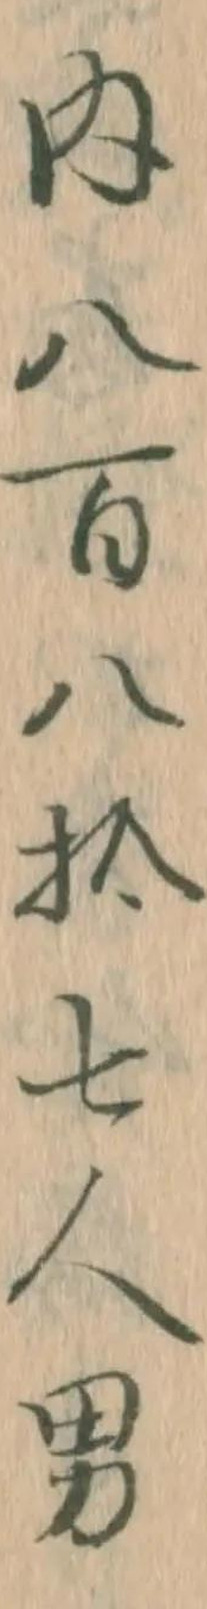内八百八拾七人男
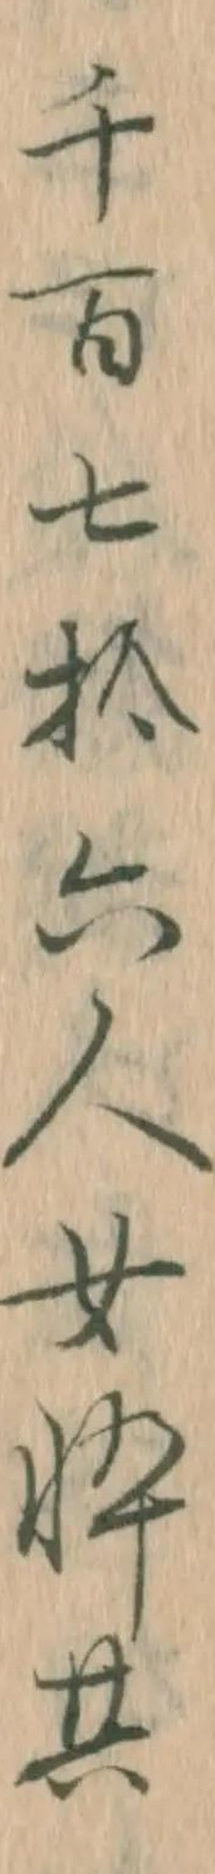千百七拾六人女忰共
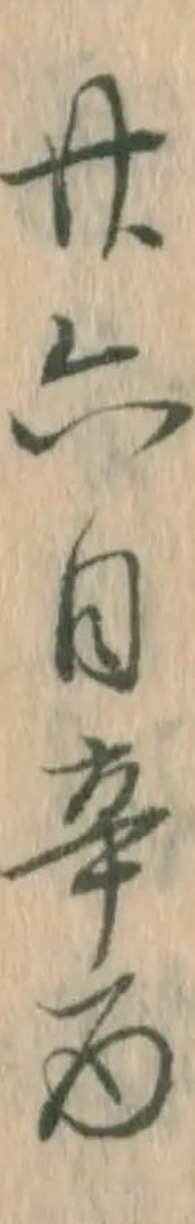廿六日辛酉
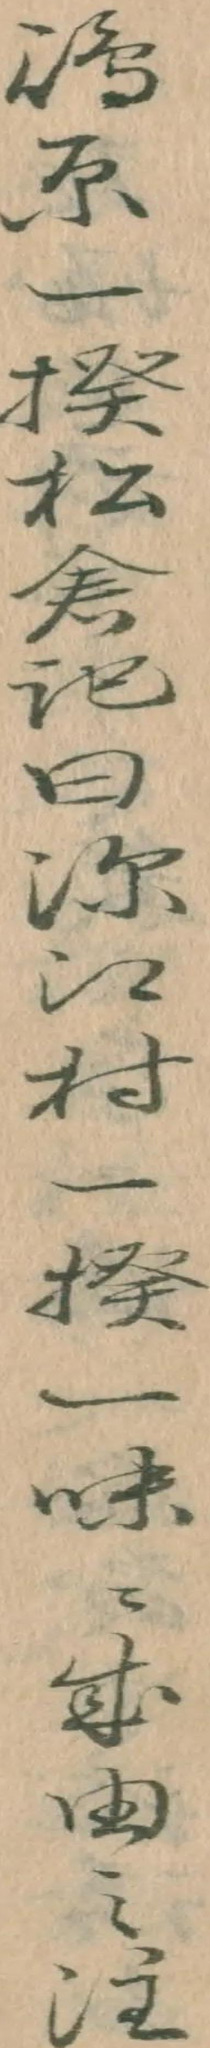島原一揆松倉記日深江村一揆一味に成由之注
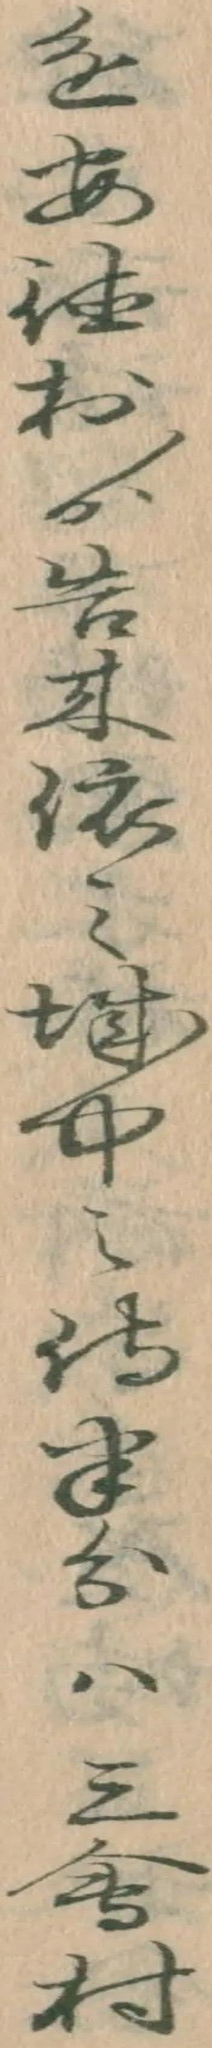進安徳村ゟ告来依之城中之侍半分は三会村
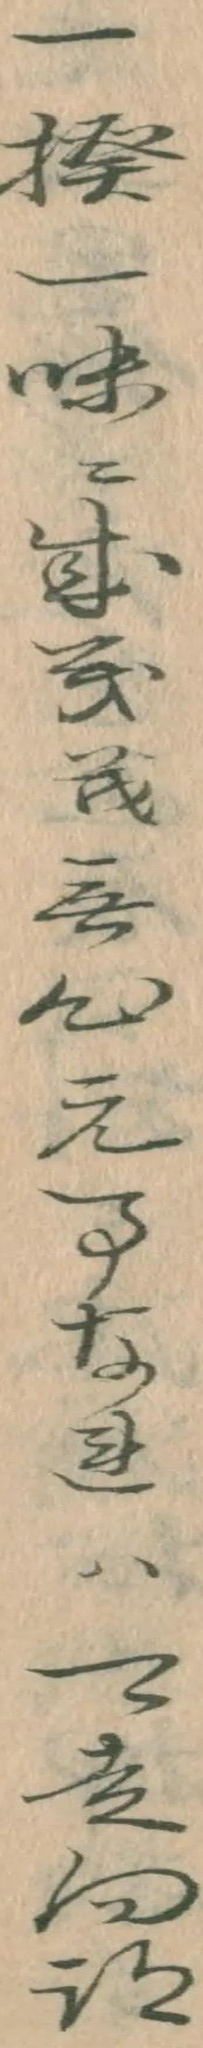一揆一味に成義も無心元事なれは可走向跡
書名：切支丹御退治記 49巻. [1]
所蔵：国立国会図書館 National Diet Library, JAPAN
